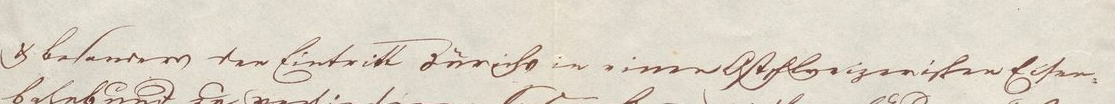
& besonders den Eintritt Zürichs in einen Ostschweizerischen Eisen-
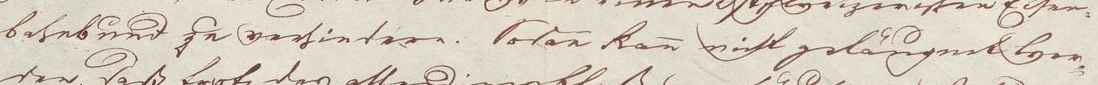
bahnbund zu verhindern. Sodann kann nicht geläugnet wer-
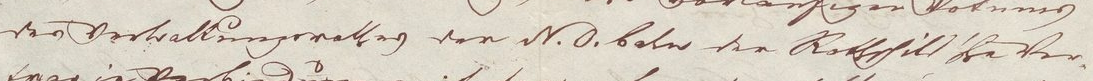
des Verwaltungsrathes der N.O.bahn der Rothschild'sche Ver-
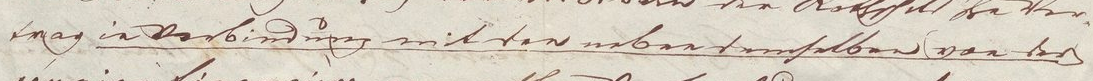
trag in Verbindung mit den neben demselben von der
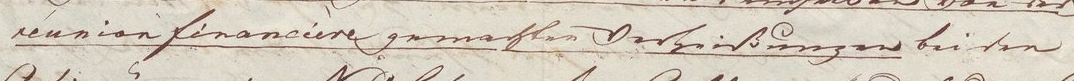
réunion financière gemachten Verheißungen bei den
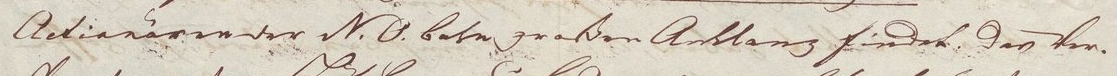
Actionären der N.O.bahn großen Anklang findet. Das Ver-
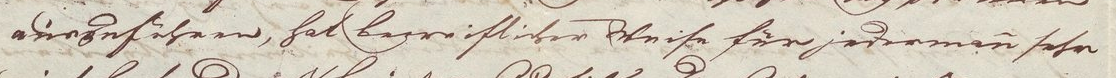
auszuführen, hat begreiflicher Weise für jedermann sehr
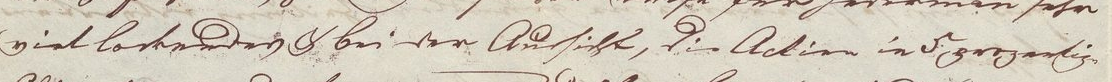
viel lockendes & bei der Aussicht, die Actien in 5prozentige
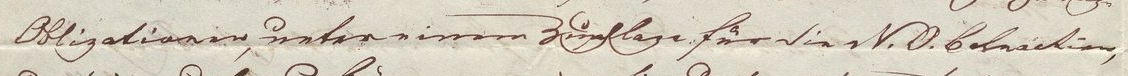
Obligationen, unter einem Zuschlage für die N.O.bahnactien,
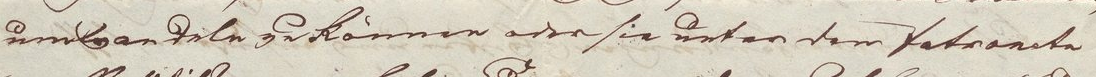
umwandeln zu können oder sie unter dem Patronate
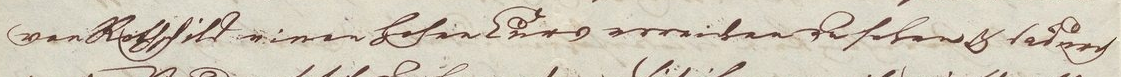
von Rothschild einen hohen Curs erreichen zu sehen & dadurch
